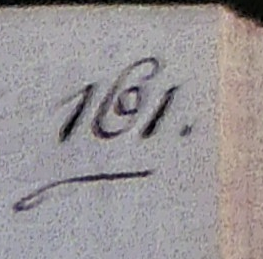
161.
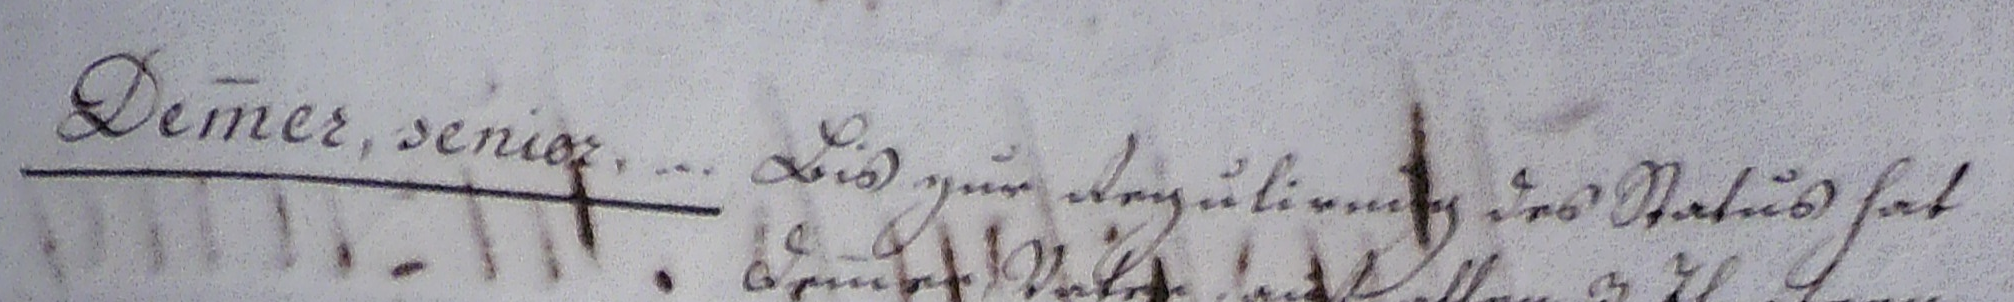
Dem̅er, senior. ... Bis zur Regulirung des Status hat
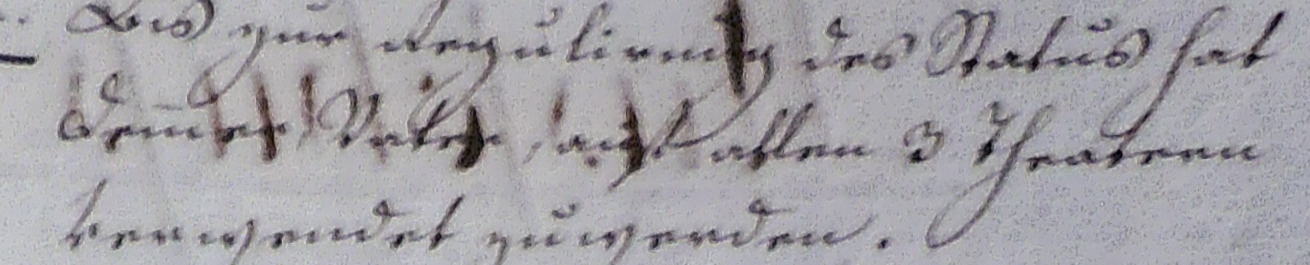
Dem̅er Vater, auf allen 3 Theatern
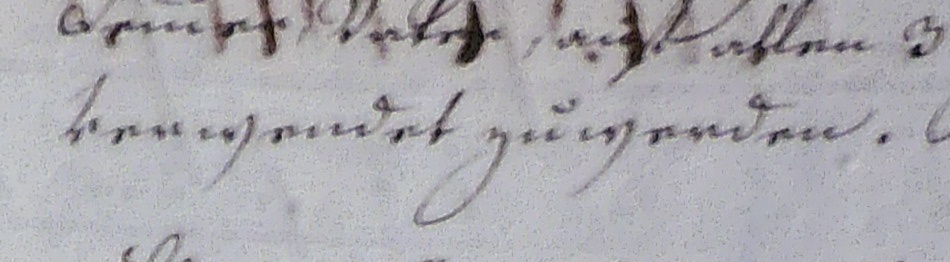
verwendet zuwerden.
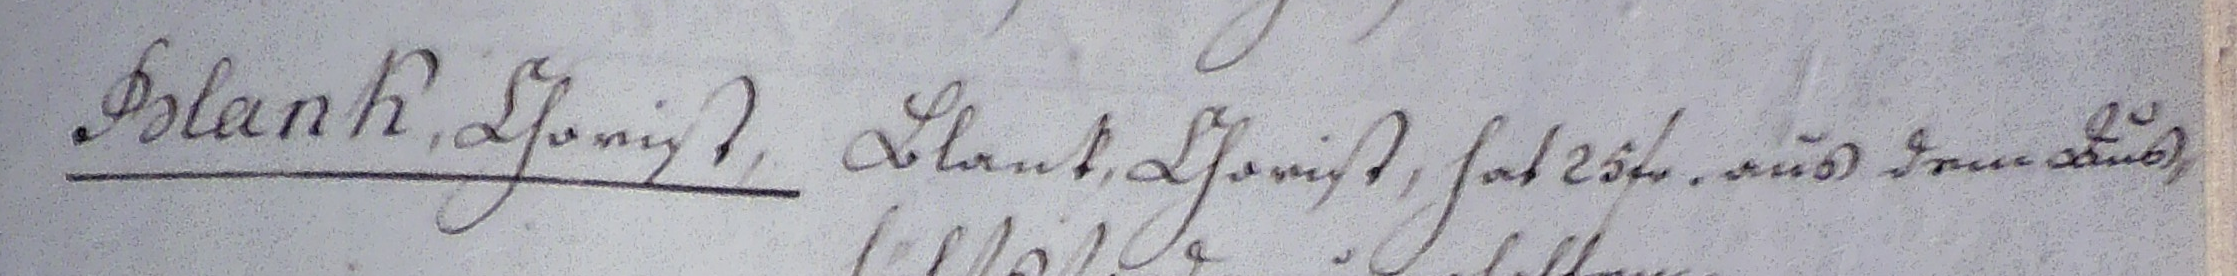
Blank, Chorist, Blank Chorist, hat 25fr. aus dem Aus¬
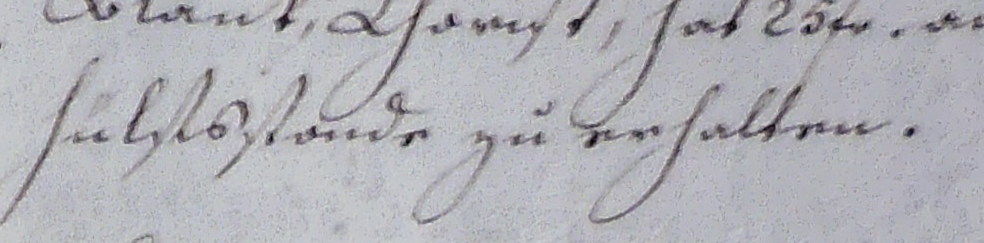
hülfsfonde zu erhalten.
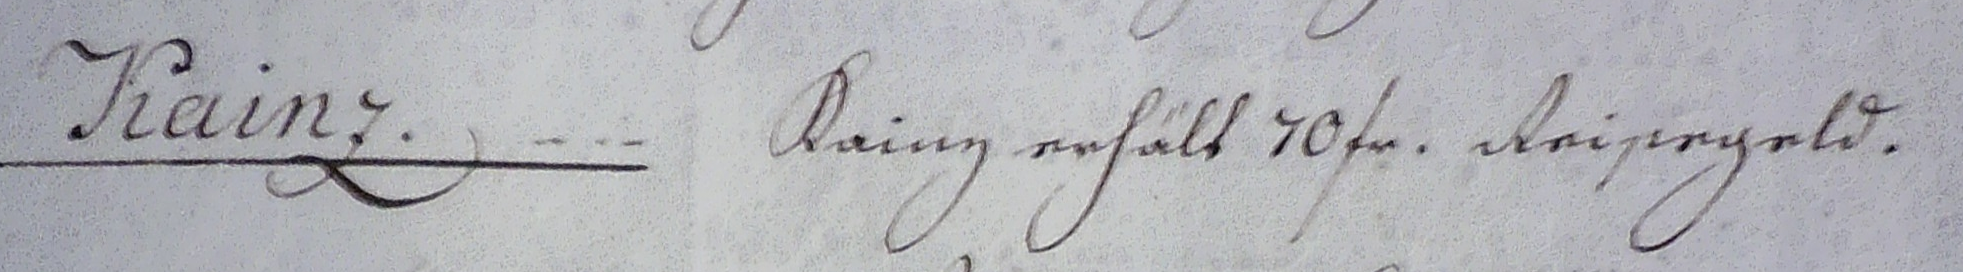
Kainz. .. .. Kainz erhält 70fr. Reisegeld.
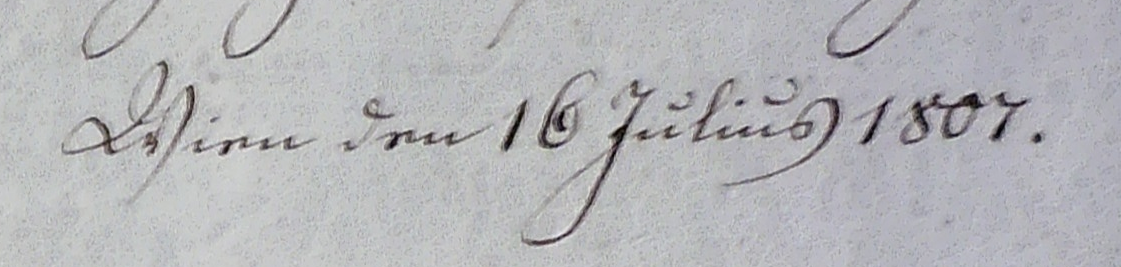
Wien den 16 Julius 1807.
